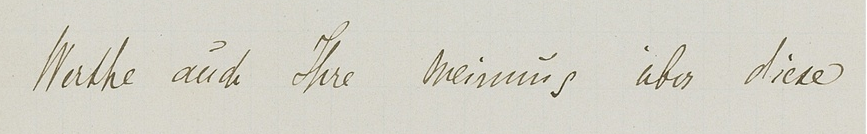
Werthe auch Ihre Meinung über diese
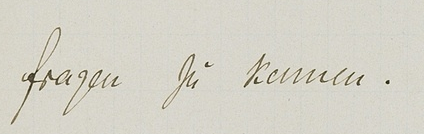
Fragen zu kennen.
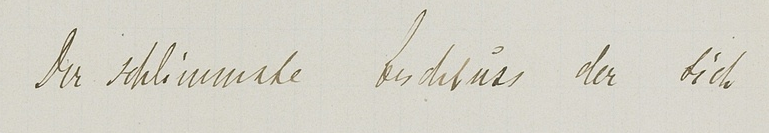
Der schlimmste Beschluss, der sich
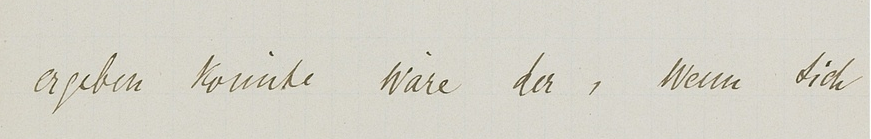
ergeben könnte wäre der, wenn sich
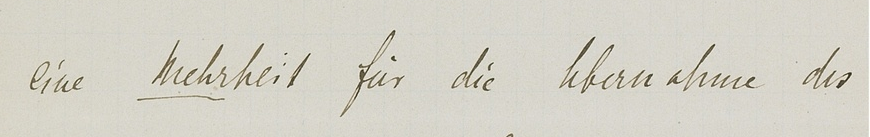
eine Mehrheit für die Übernahme des
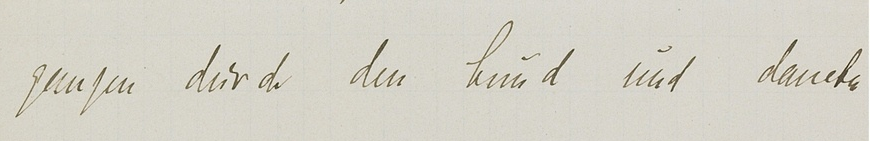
ganzen durch den Bund und daneben
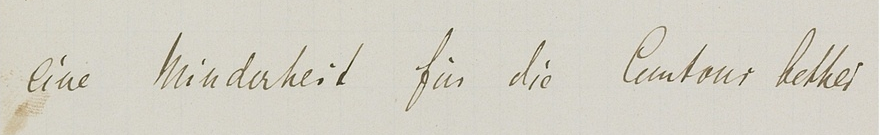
eine Minderheit für die Cantons Bethei-
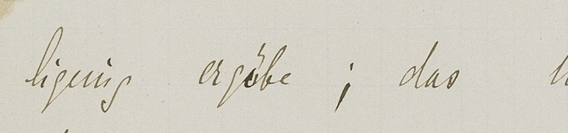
ligung ergäbe; das
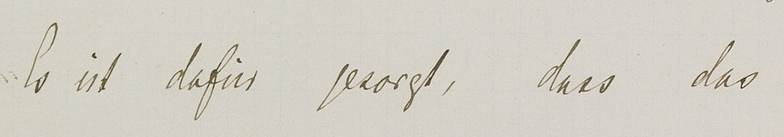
Es ist dafür gesorgt, dass das
